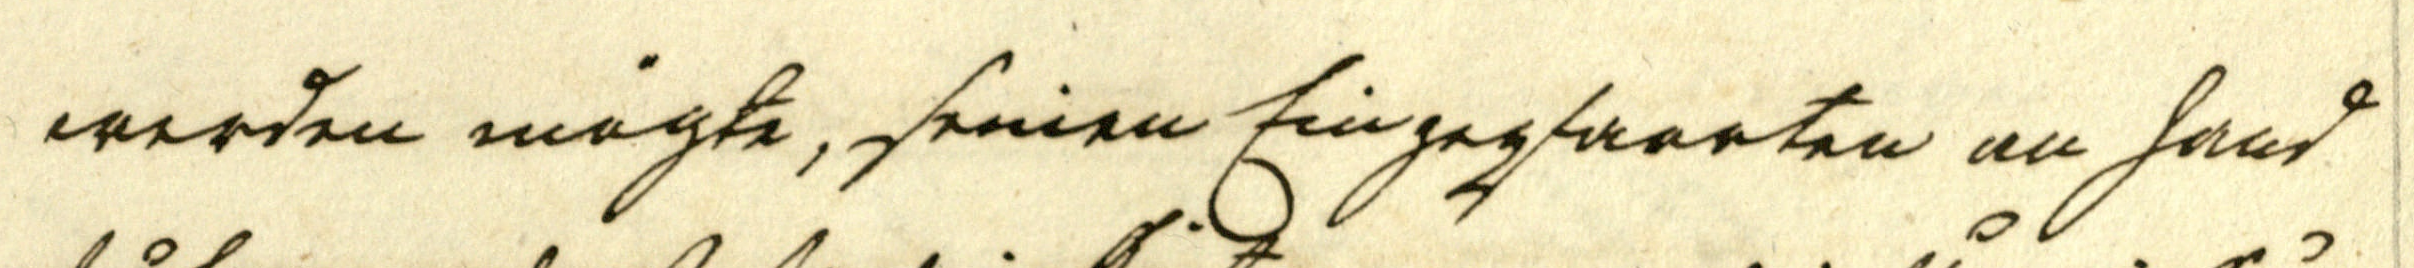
werden mögte, seinen Eingepfarrten an Hand
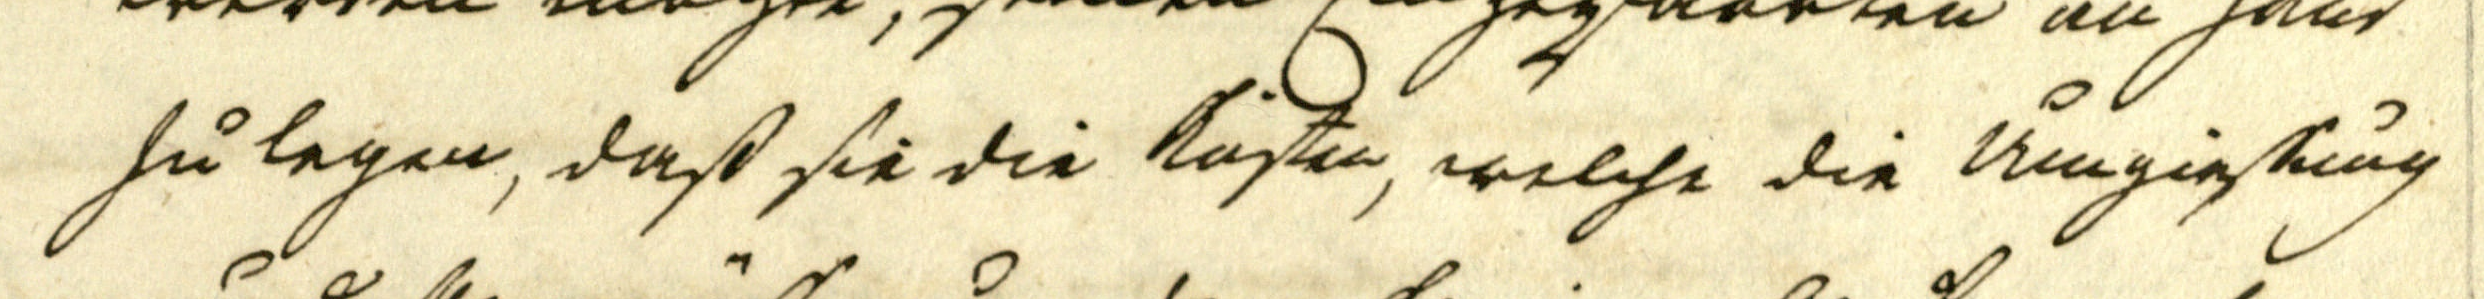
zu legen, daß sie die Kosten, welche die Umgiessung
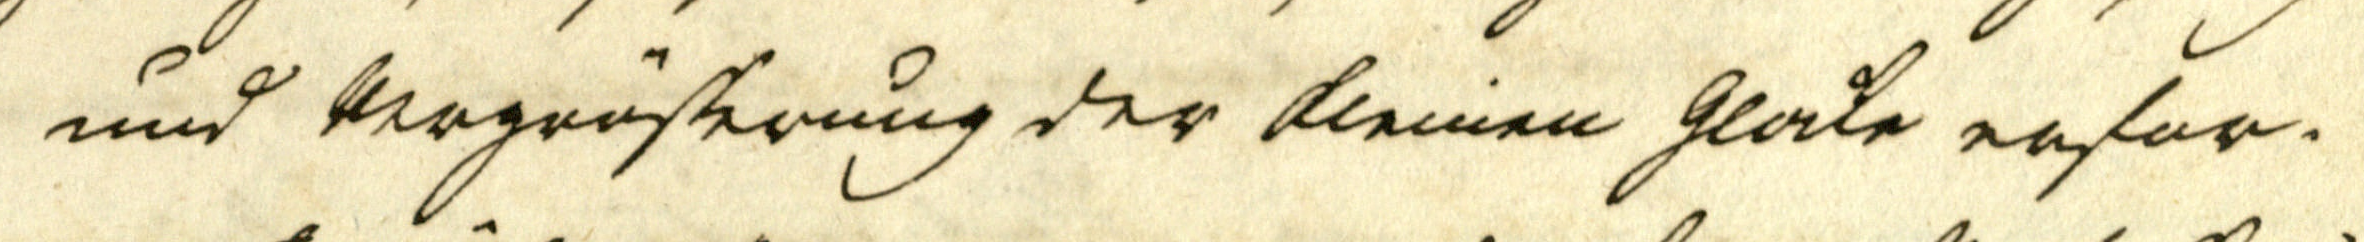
und Vergrösserung der keinen Glocke erfor¬
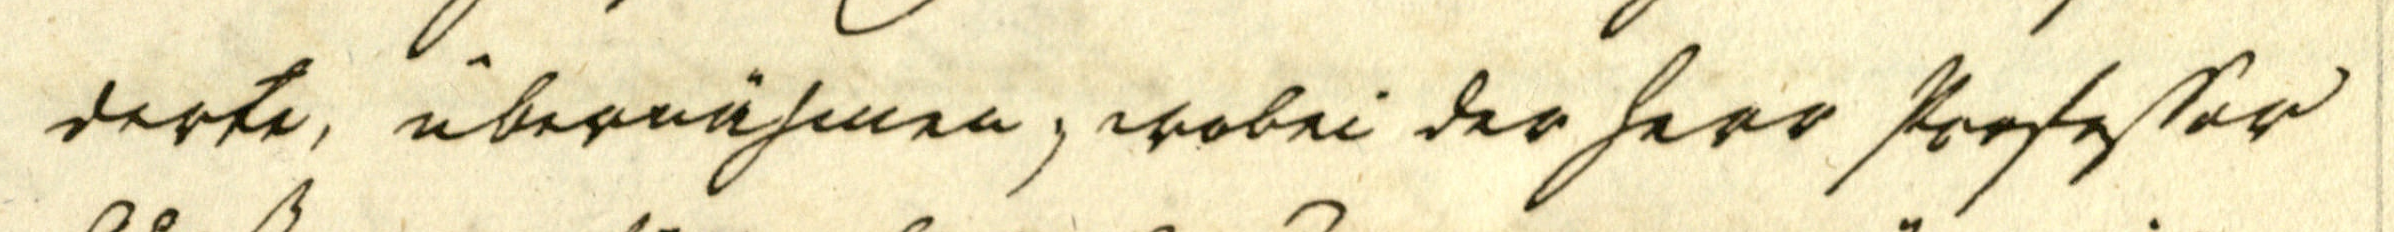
derte, übernähmen, wobei der Herr Professor
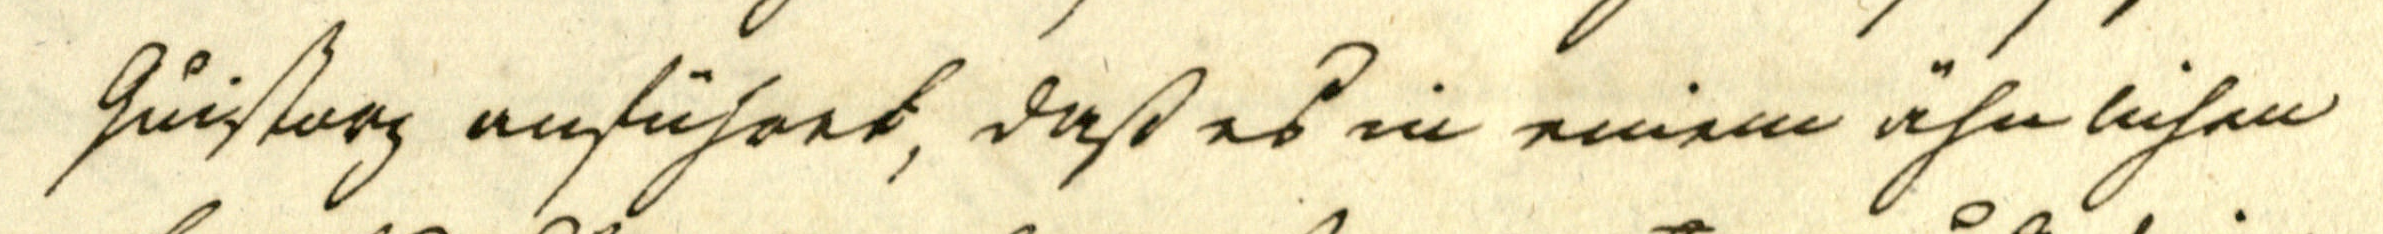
Quistorp anführet, daß es in einem ähnlichen
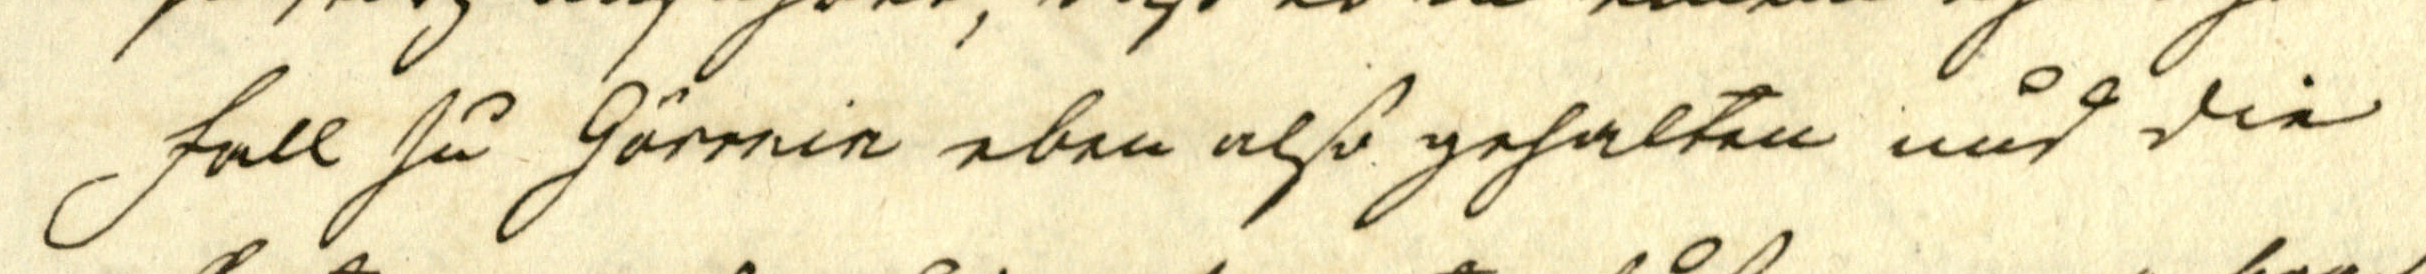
Fall zu Görmnin eben also gehalten und die
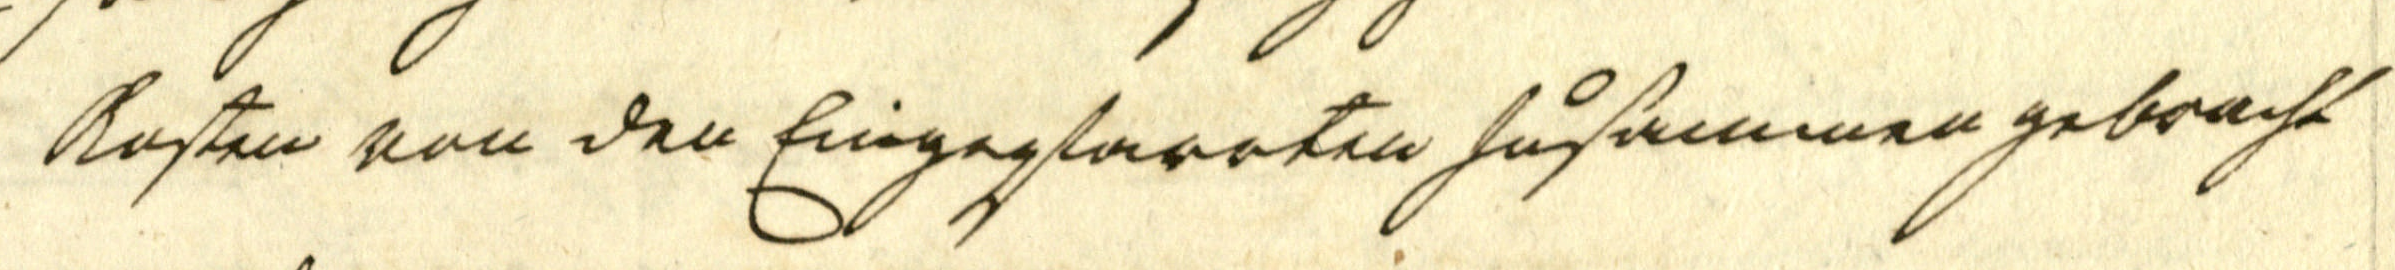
Kosten von den Eingegfarrten zusammen gebracht
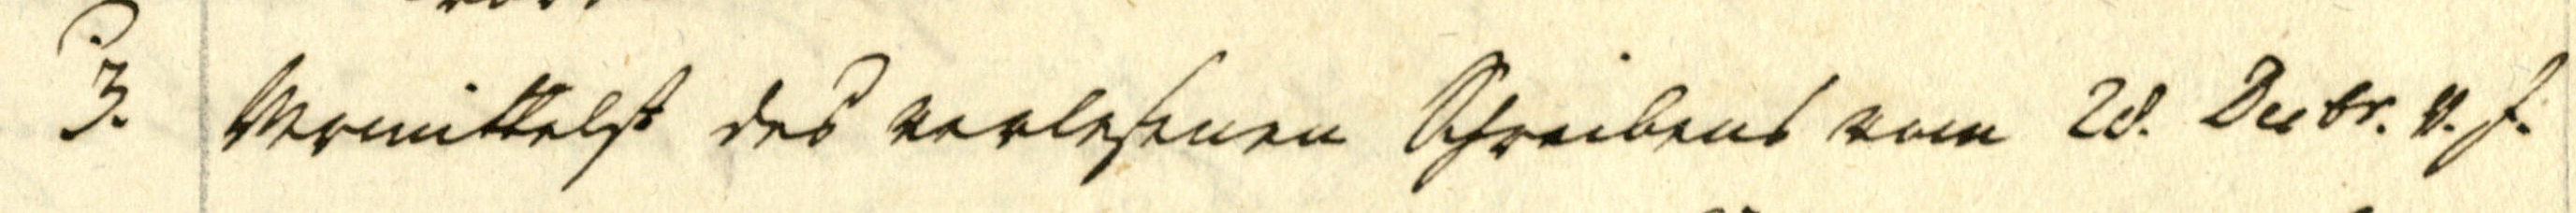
3. Vermittelst des verlesenen Schreibens vom 28. Decbr. v. J.
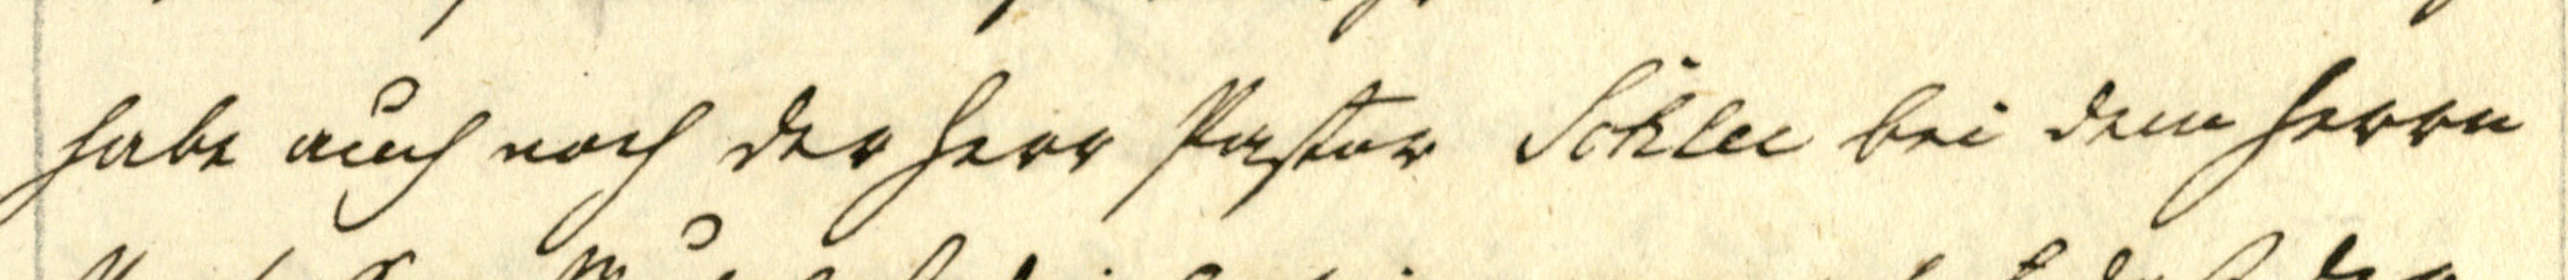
habe auch noch der Herr Pastor Schlee bei dem Herrn
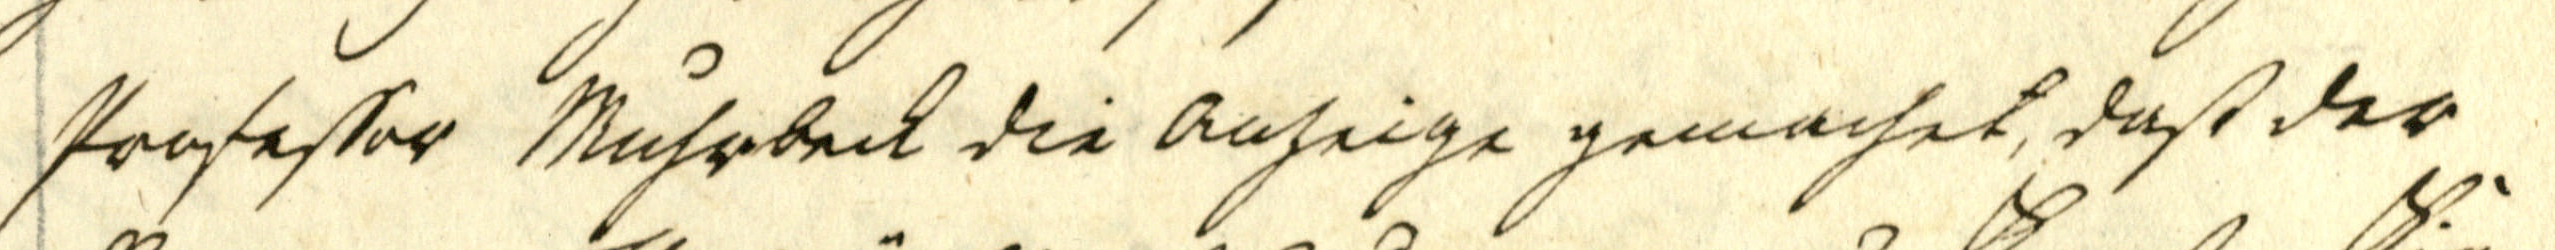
Professor Muhrbeck die Anzeige gemachet, daß der
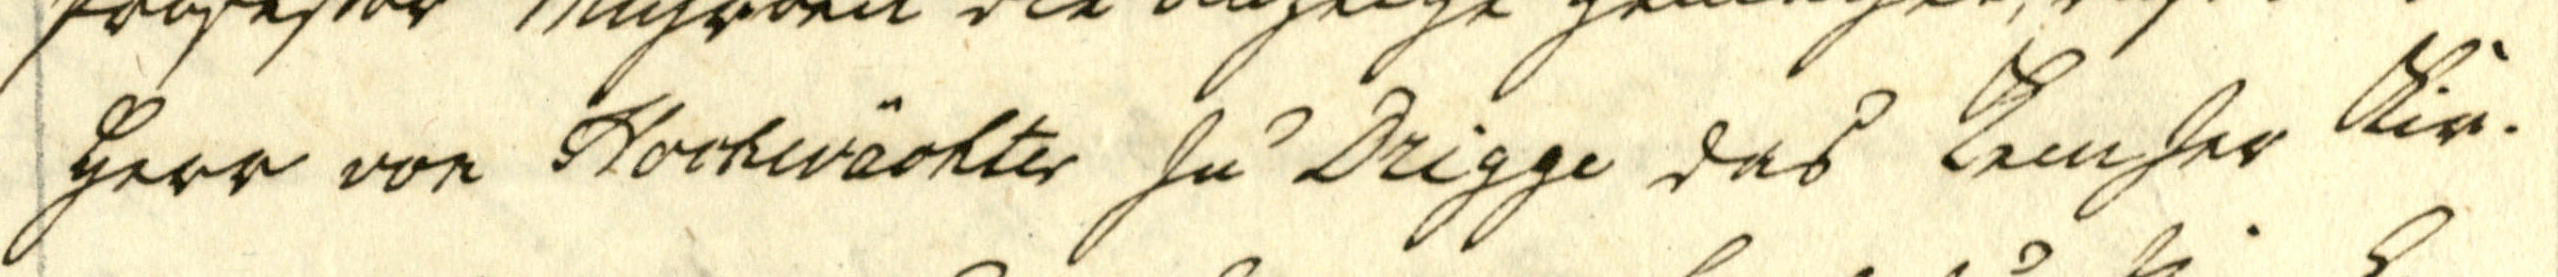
Herr von Hochwächter zu Drigge das Kemzer Kir¬
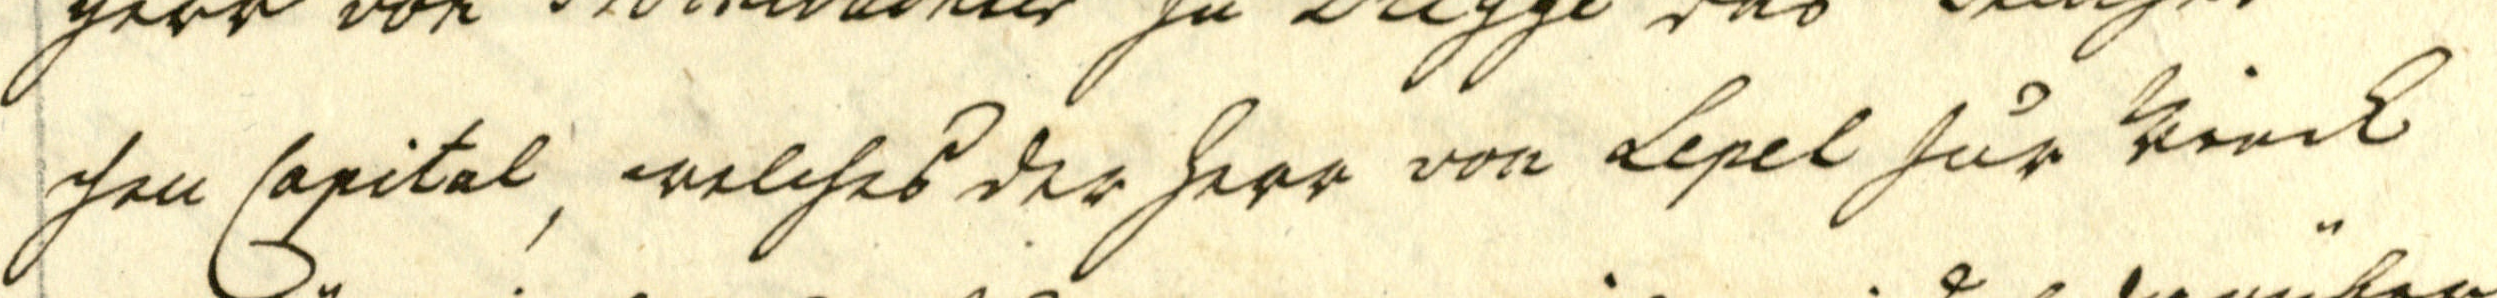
chen Capital, welches der Herr von Lepel zur Wieck
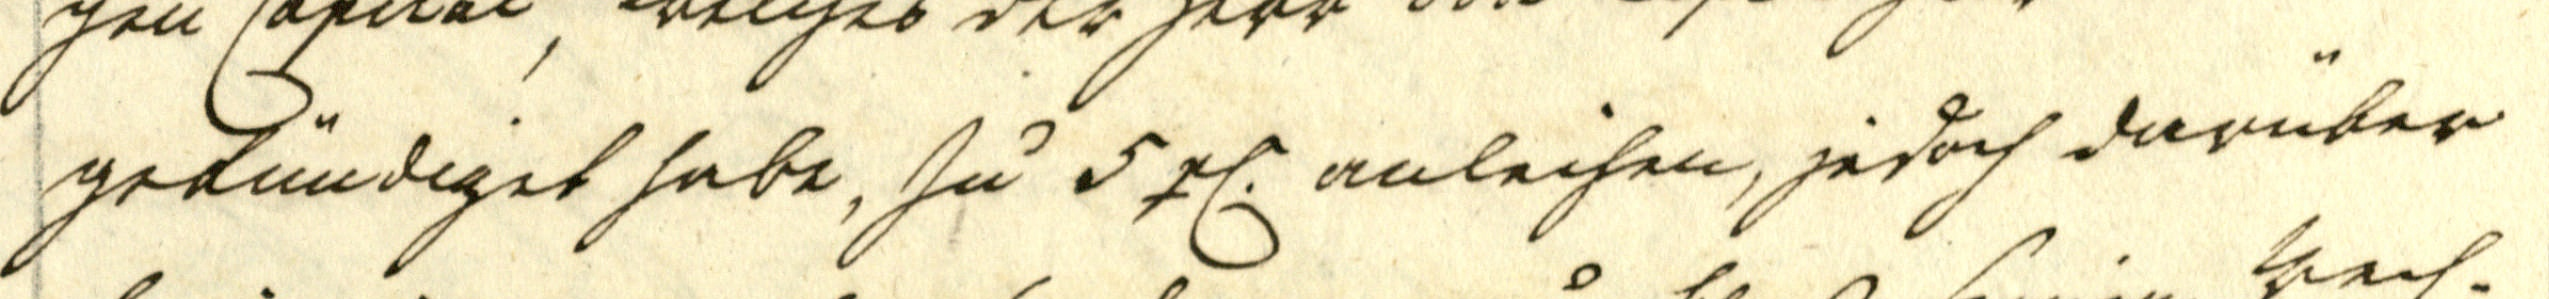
gekündiget habe, zu 5 r. anleihen, jedoch darüber
